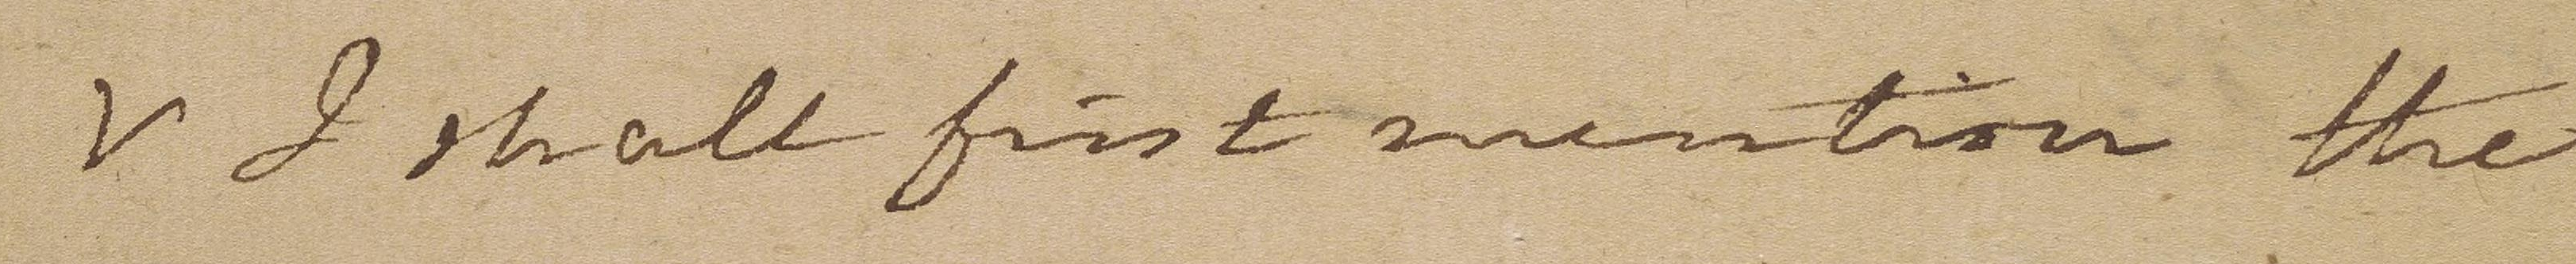V I shall first mention the
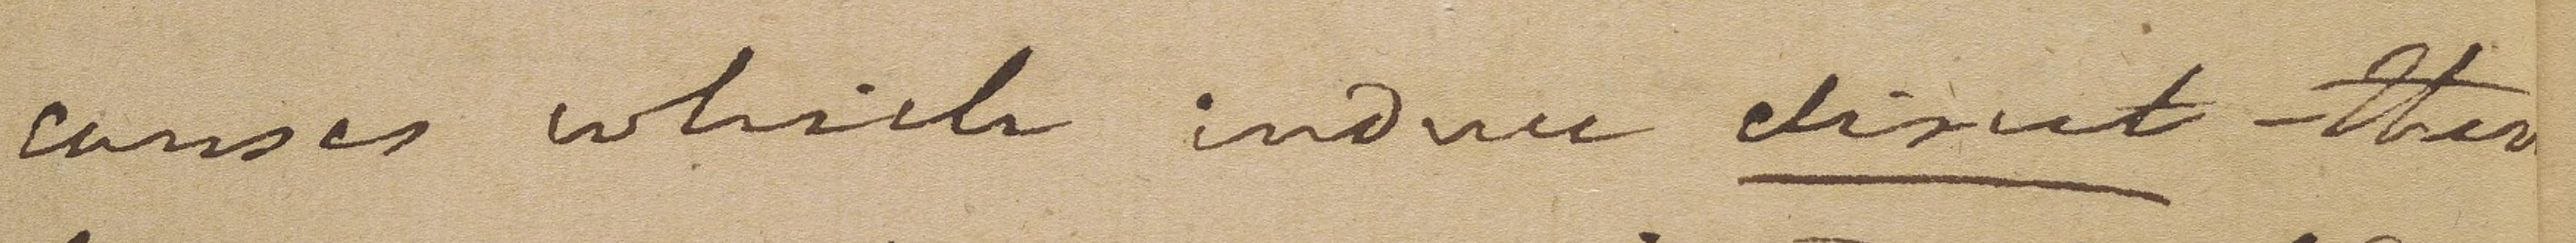causes which induce direct, then
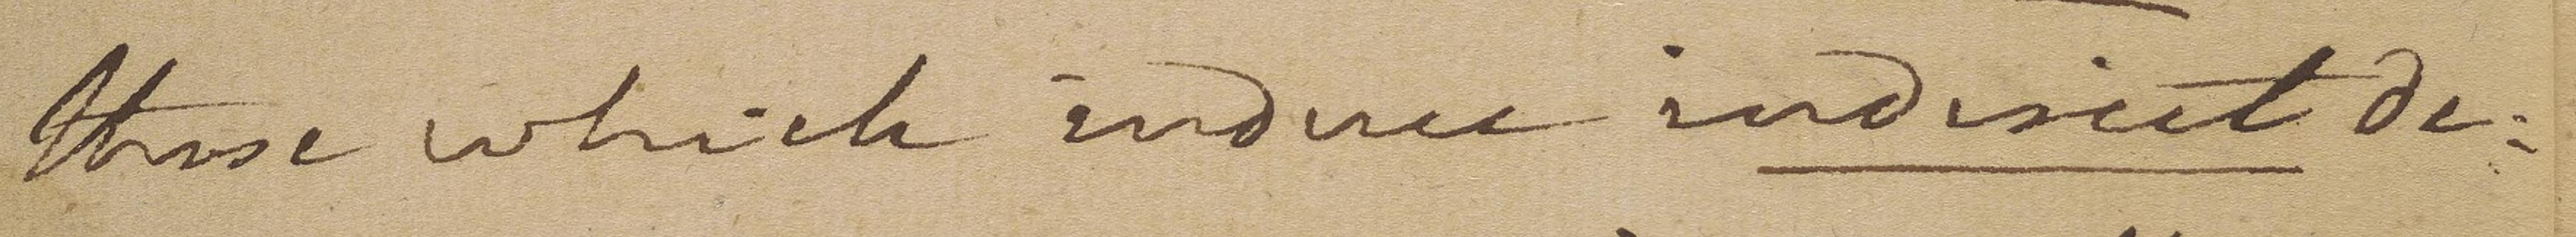those which induce indirect de-
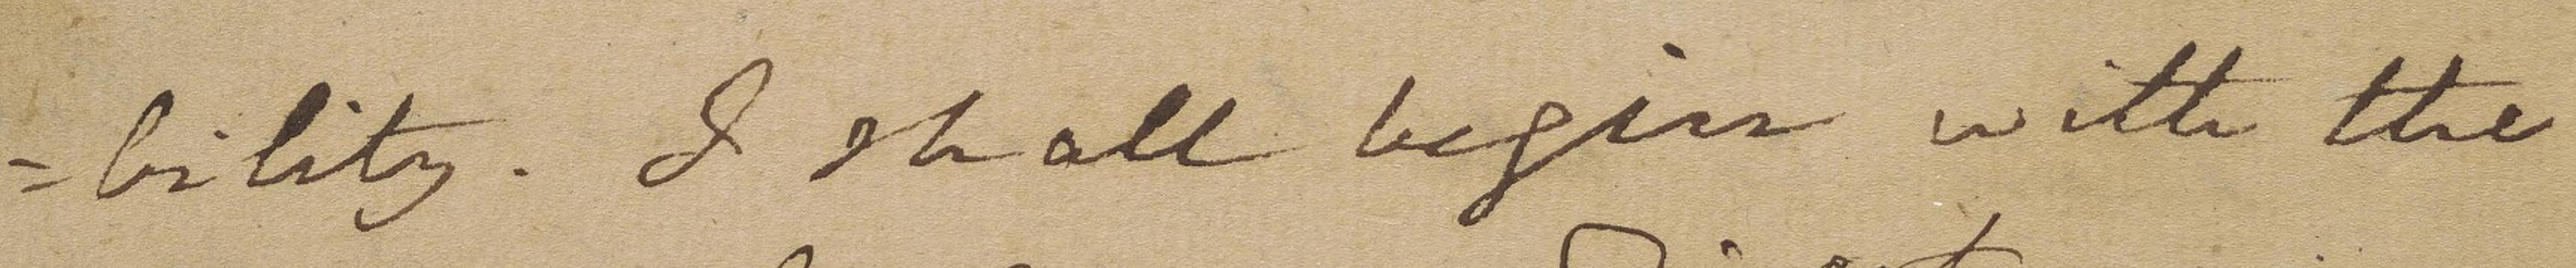-bility. I shall begin with the
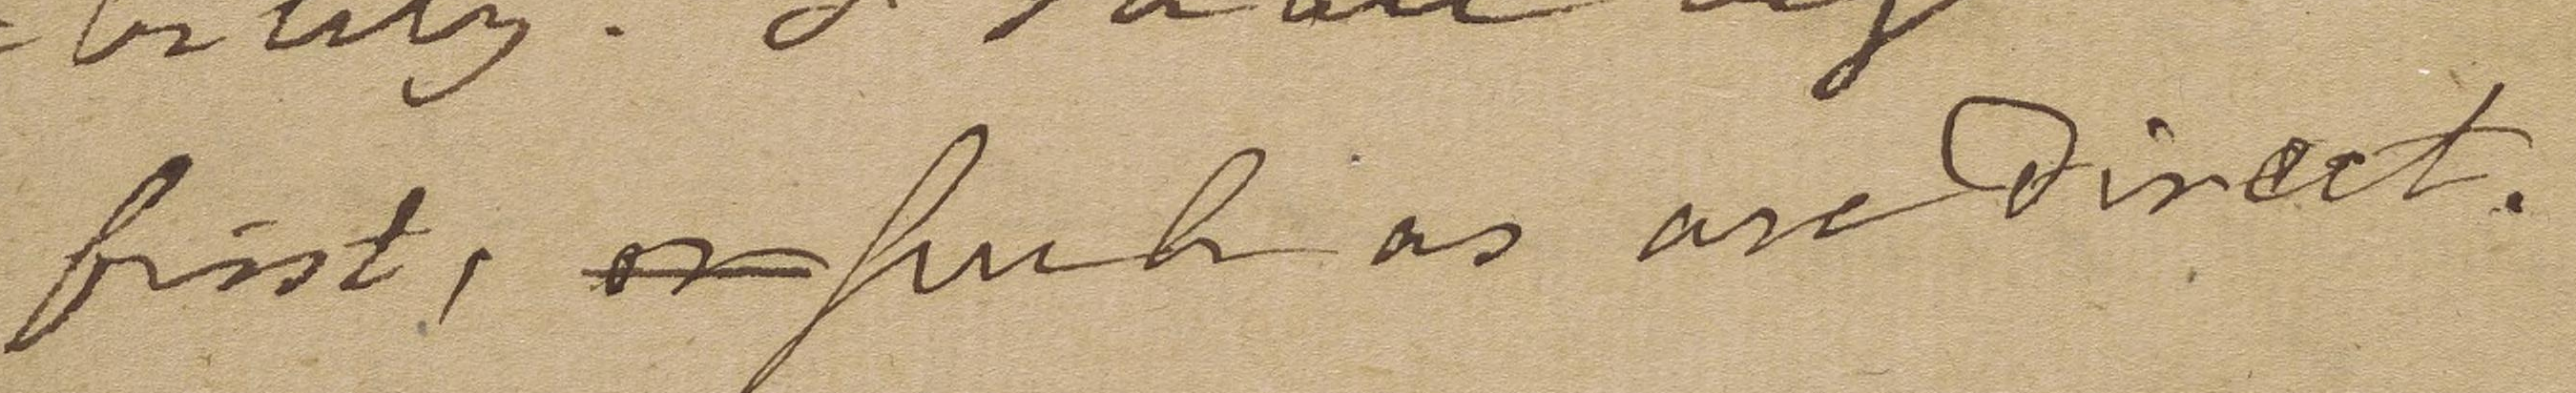first, or such as are direct.
